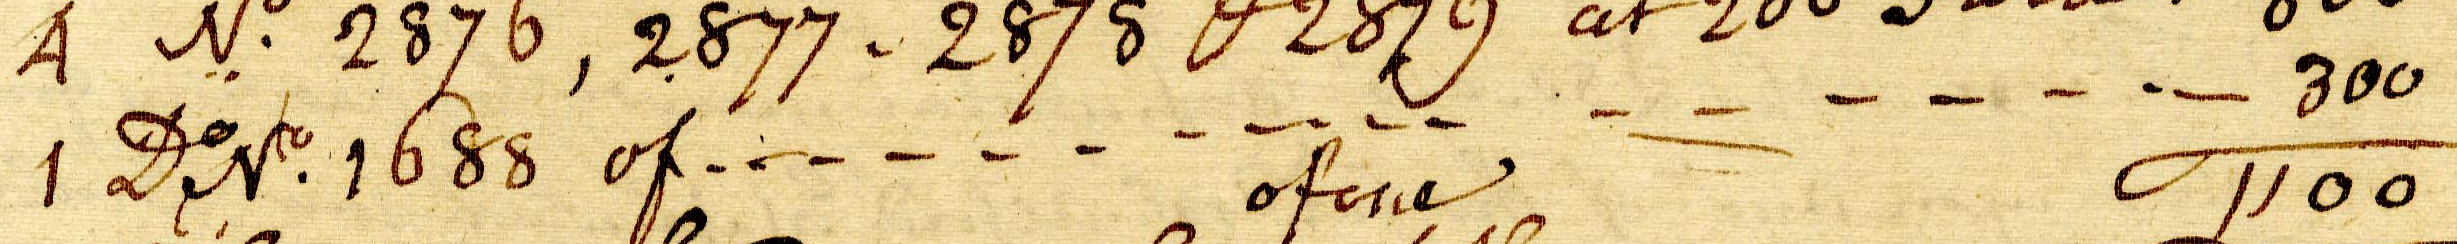1 D^o N^o. 1680 of----------------300
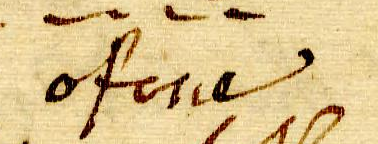of one
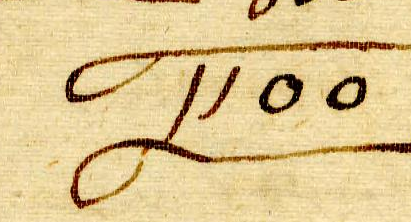1100
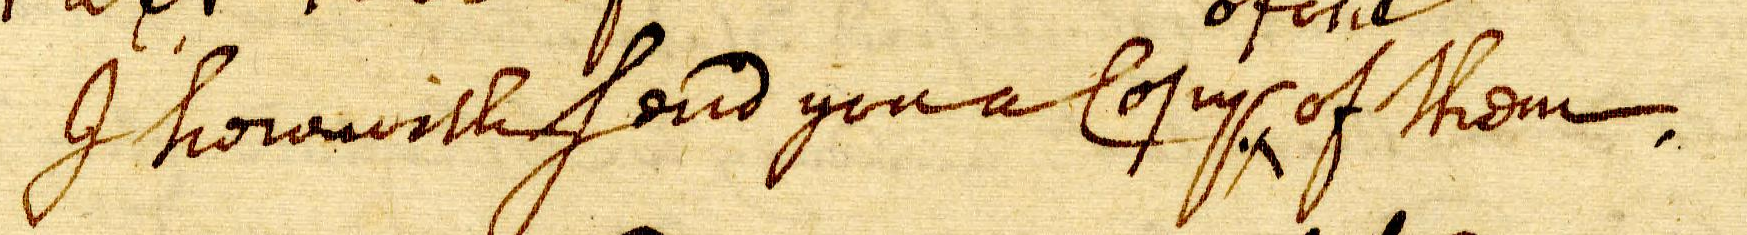I herewith send you a Copy ^ of them.
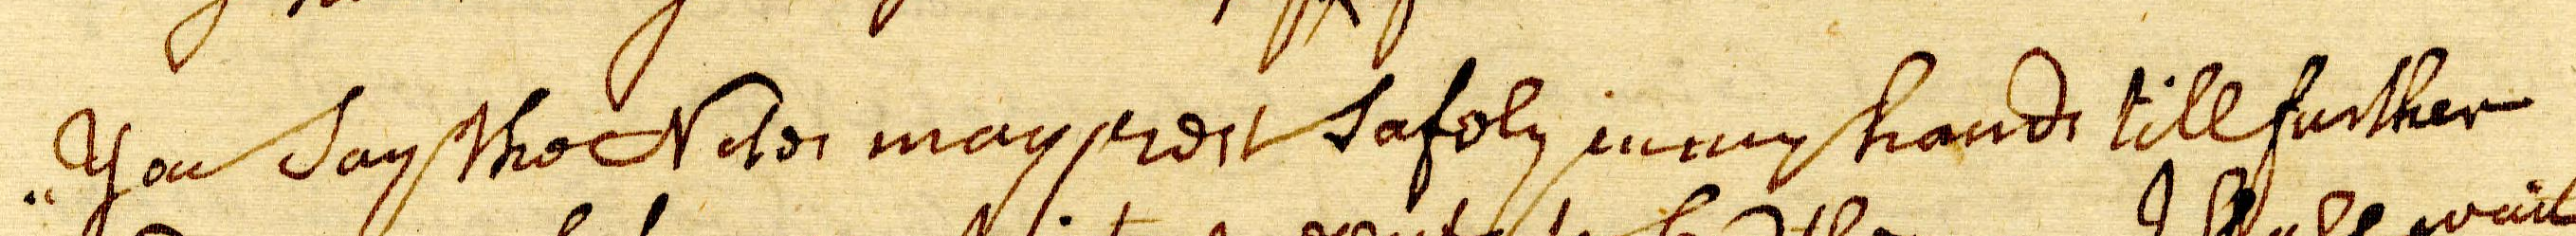You Say the Notes may rest Safely in my hands till further
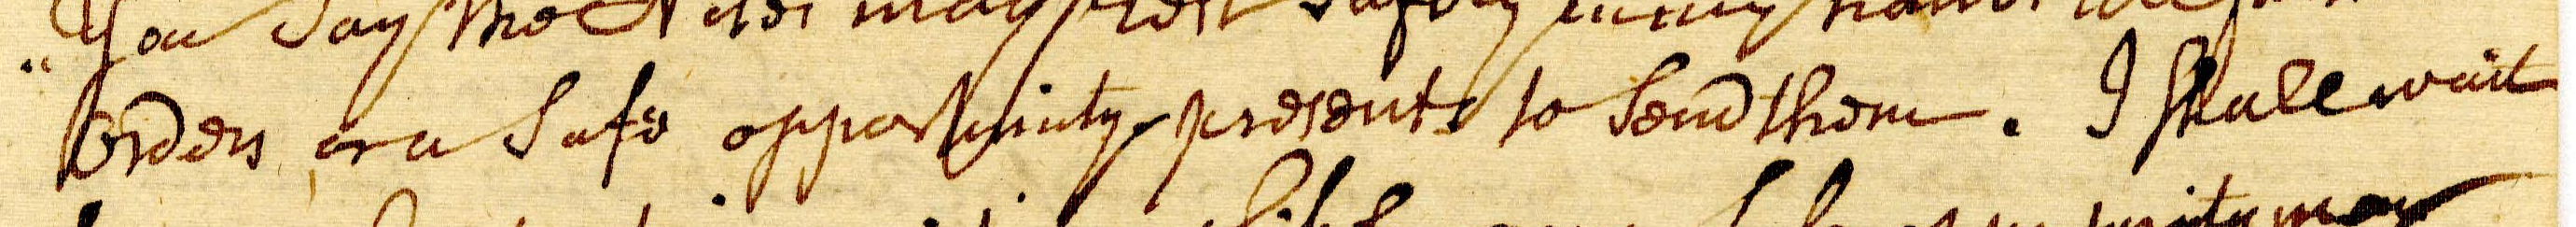Orders or a safe opportunity presents to send them. I shall wait
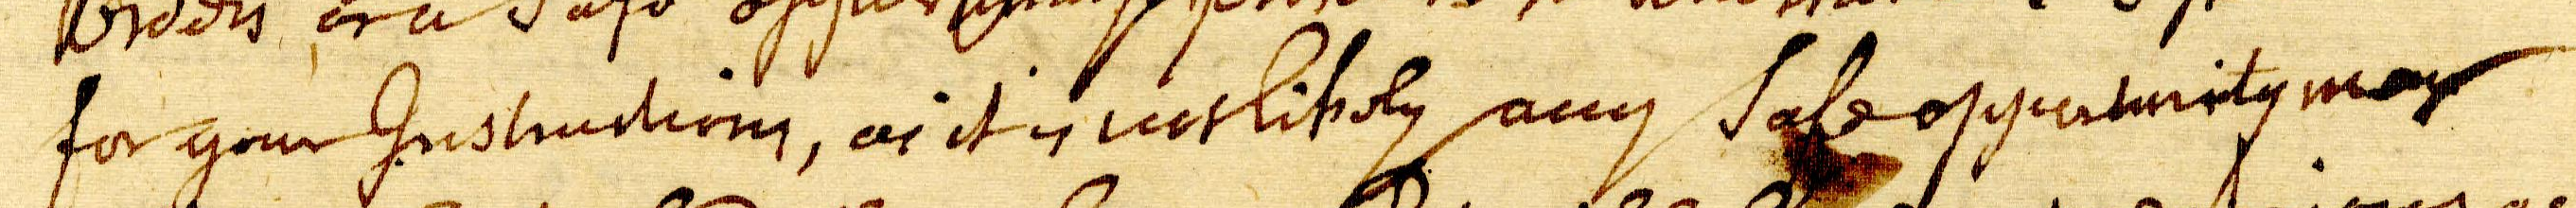for your Instructions, as it is not likely any safe opportunity may
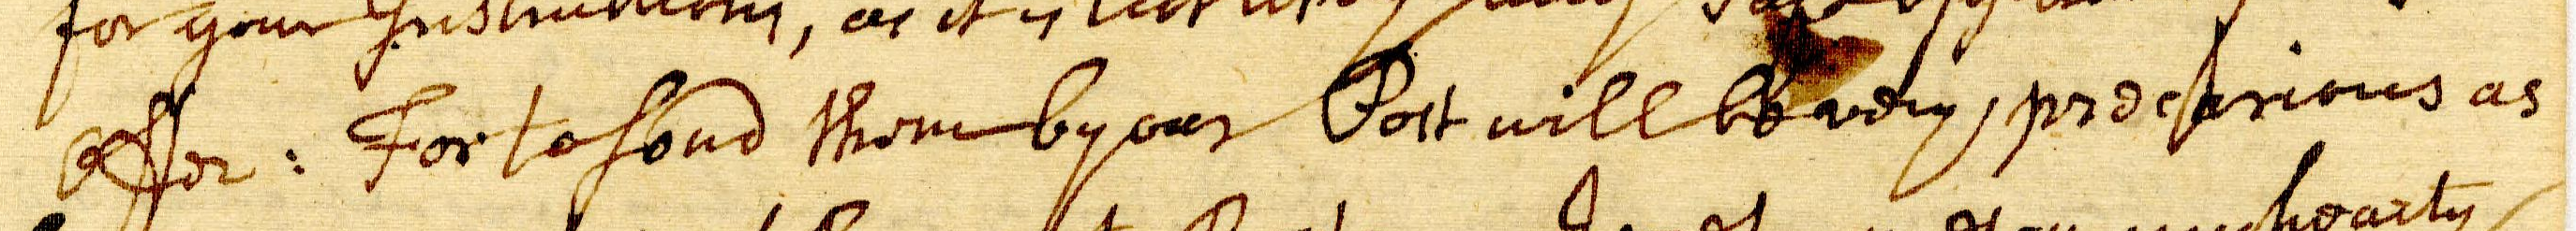offer: For to send them by our Post will be very precarious as
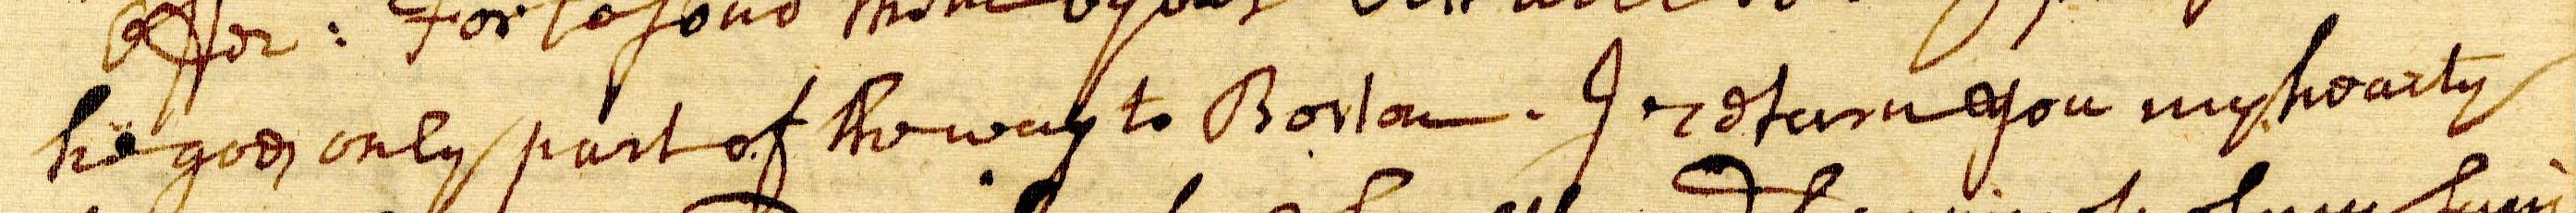he goes only part of the way to Boston. I return You my hearty
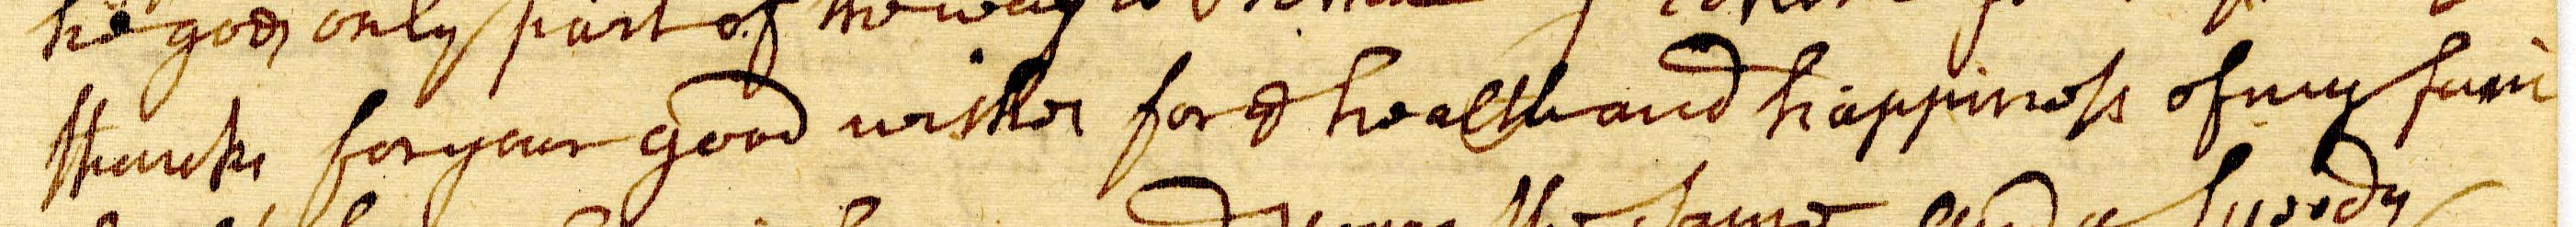thanks for your good wishes for y^e health and happiness of my fami
